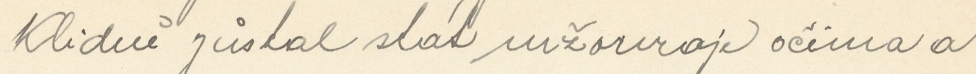klidně zůstal stát mžouraje očima a
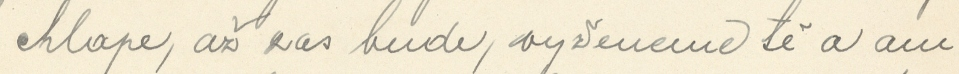chlape, až zas bude, vyženeme tě a ani
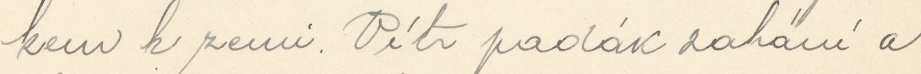kem k zemi. Vítr padák zahání a
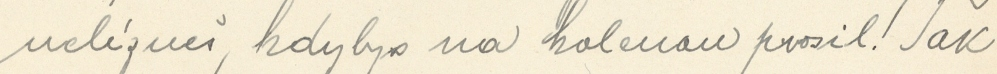nalízneš, kdybys na kolenou prosil! Tak
